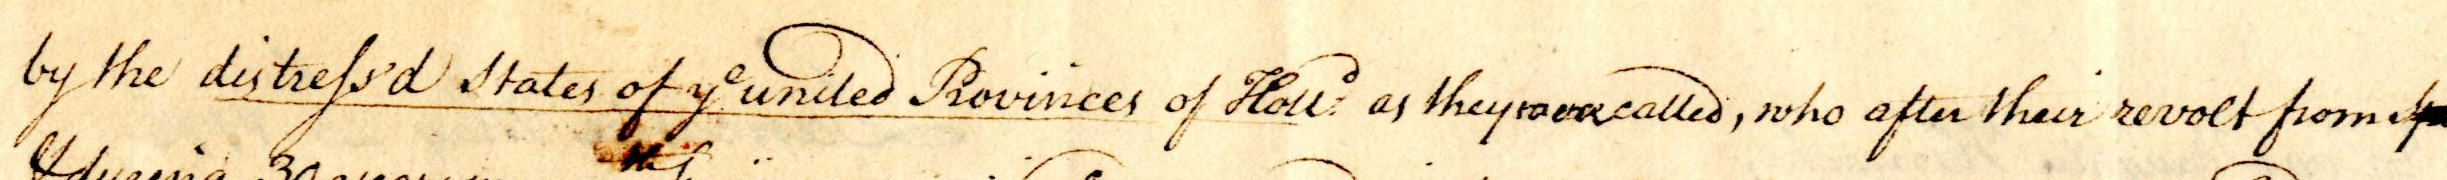by the distress'd States of y^e United Provinces of Holl^d: as they are called, who after their revolt from
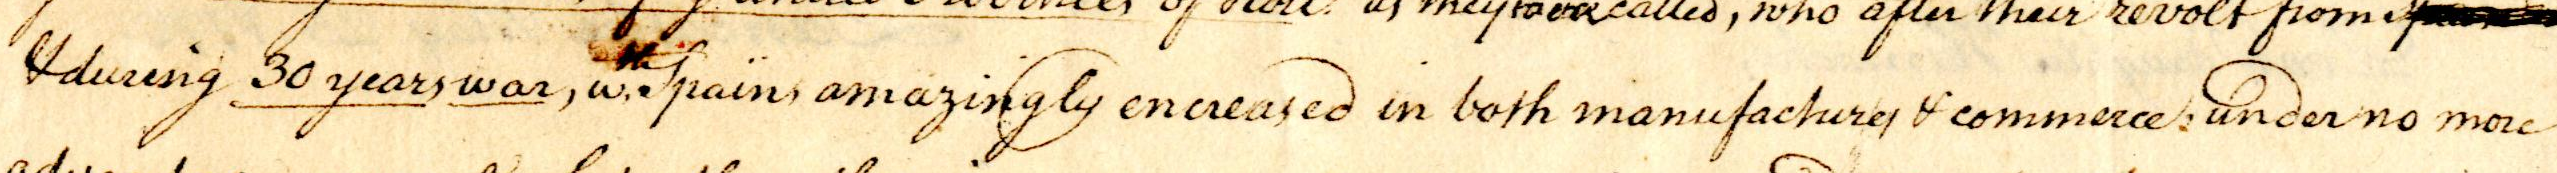& during 30 years war , w^th. Spain, amazingly encreased in both manufactures & commerce: under no more
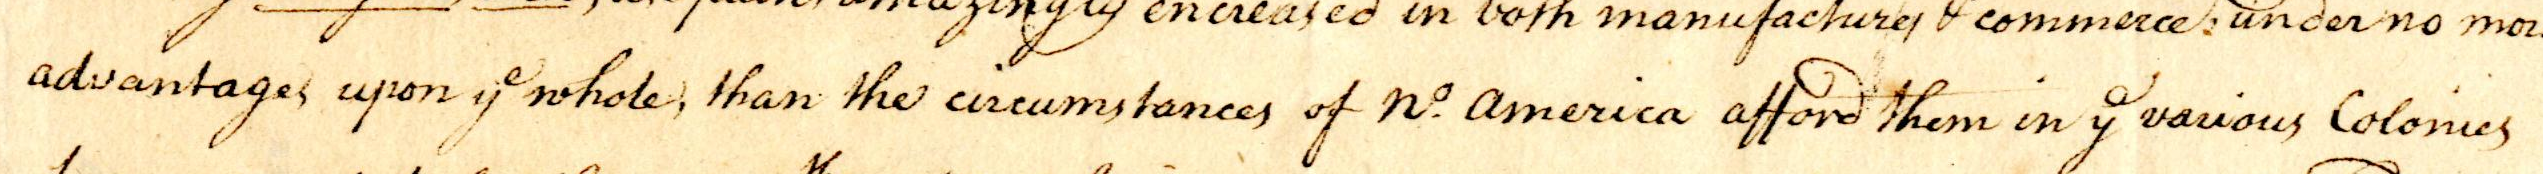advantages upon y^e whole, than the circumstances of N^o. America afford them in y^e various Colonies
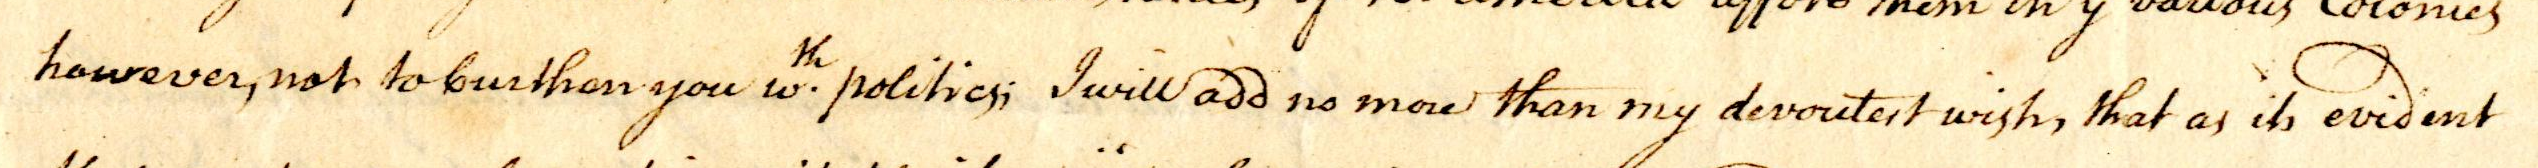however, not to burthen you w^th. politics; I will add no more than my devoutest wish, that as its evident
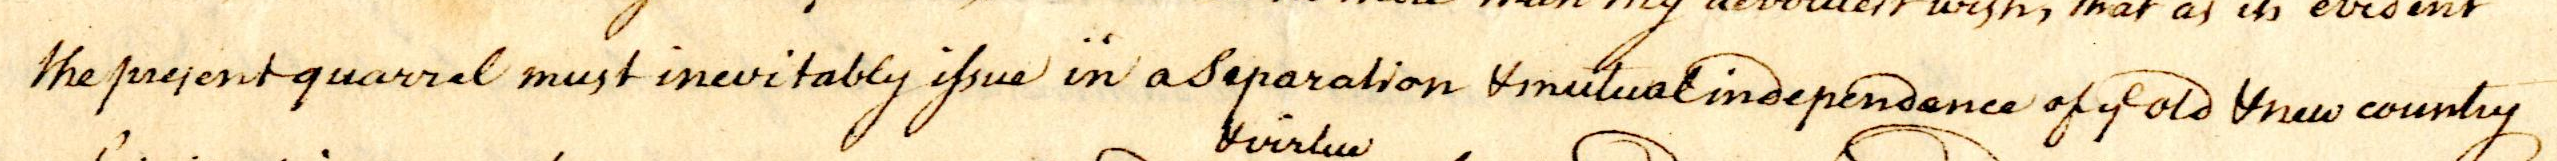the present quarrel must inevitably issue in a Separation & mutual independance of y^ old & new country
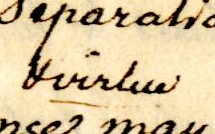& virtue
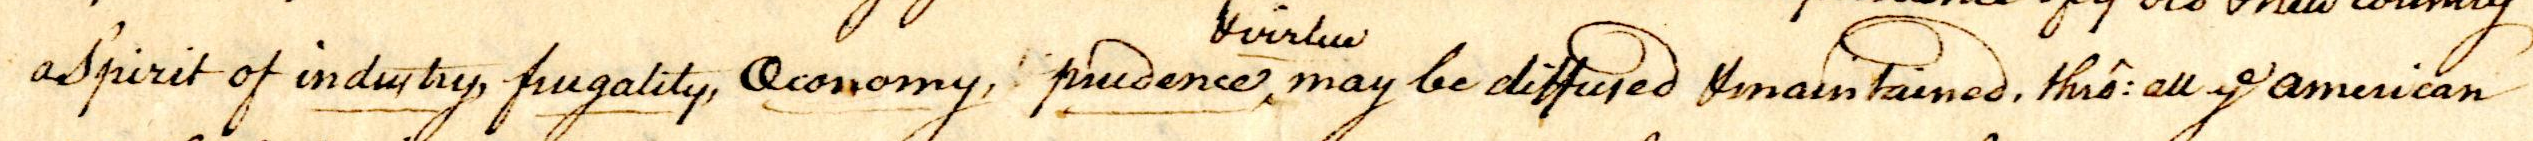a Spirit of industry, frugality, economy, prudence ^ may be diffused & maintained, this: all y^e American
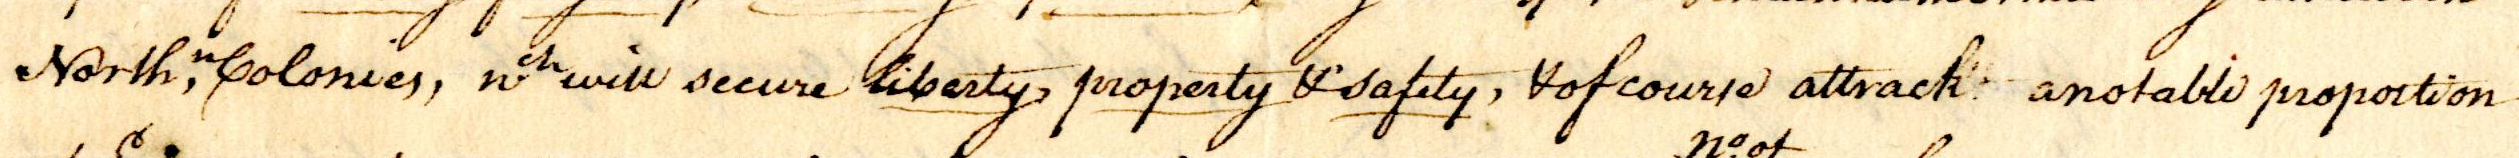North^n. Colonies, w^ch will secure liberty, property & safety, & of course attrack: anotable proportion
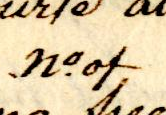N^o. of
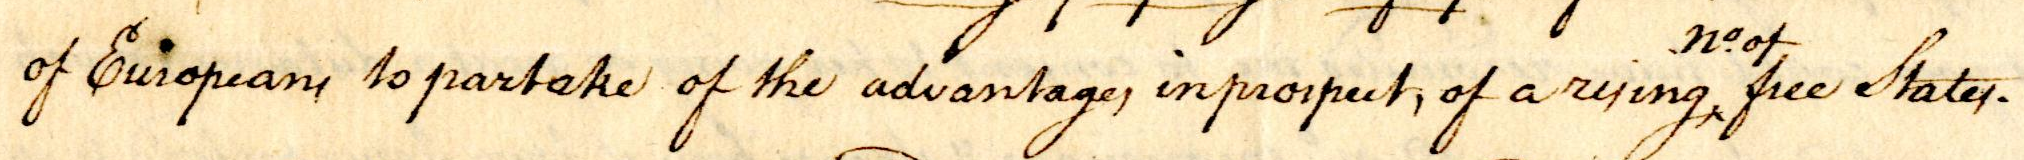of Europeans to partake of the advantages in prospect, of a rising ^ free States.
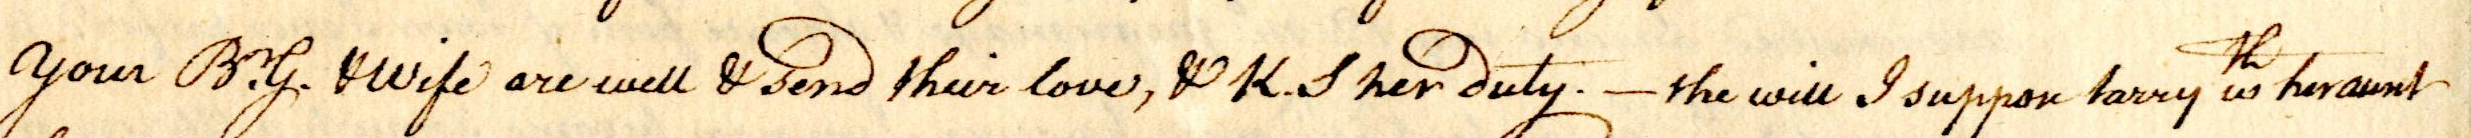Your B^r. G. & Wife are well & send their love, & K.S her duty.- she will I suppose tarry w^th her aunt
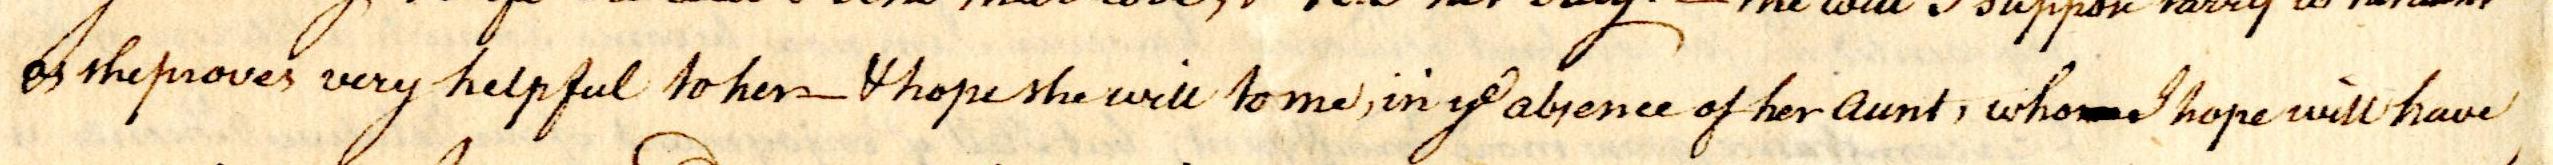as she proves very helpful to her- & I hope she will to me, in y^e absence of her Aunt, who I hope will have
